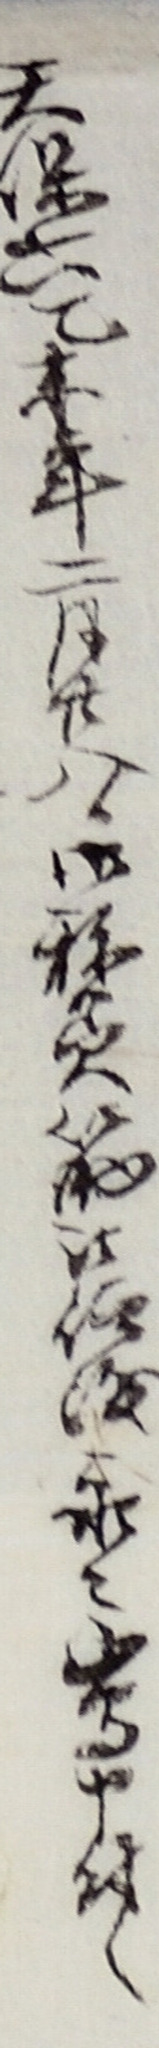天保六乙未年二月廿八日御称美筋被仰渡永々山守申付候
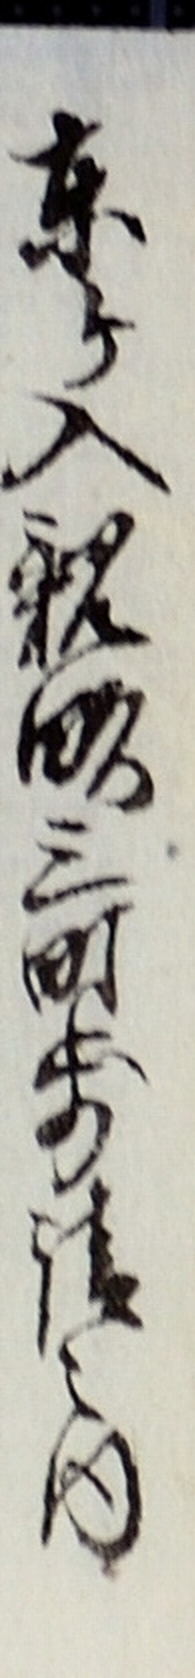東ケ入親畝三町歩請之内
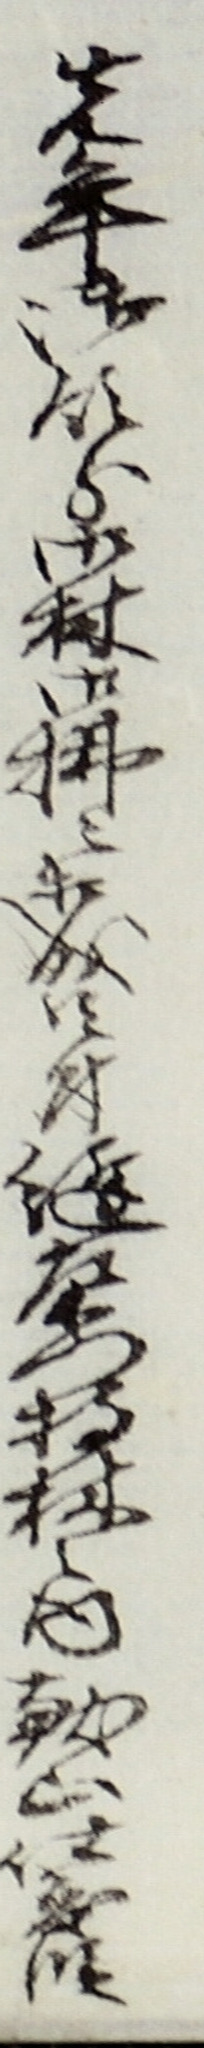先年御領分御林御払ニ相成候付縫左衛門持林之内献山仕度段
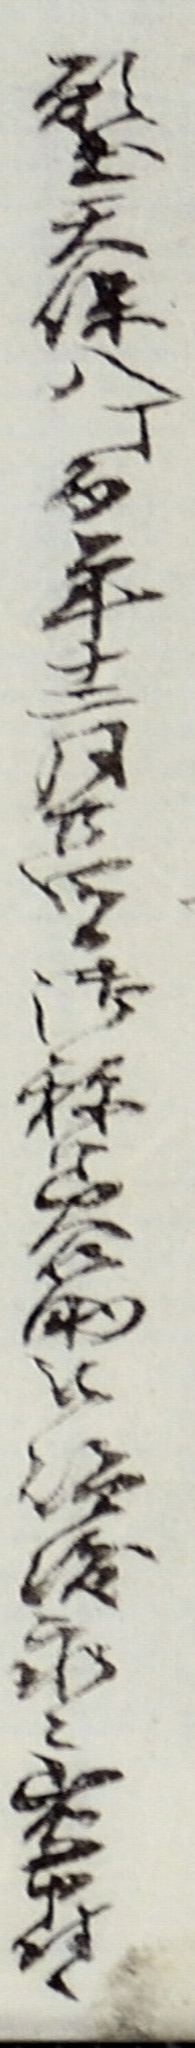願出天保八丁酉年十二月廿四日御称美筋被仰渡永々山守申付候

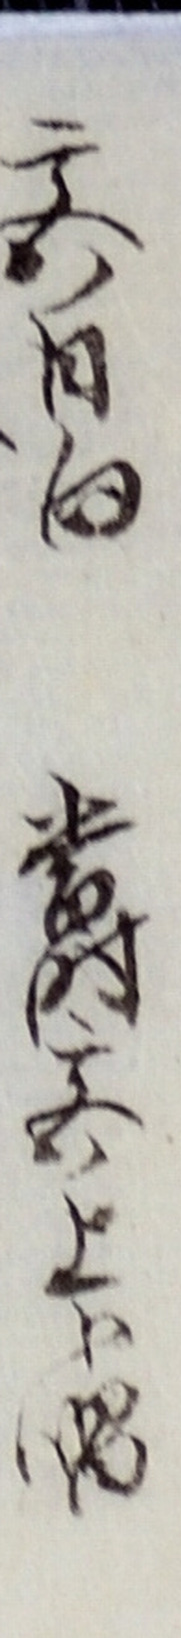宮ノ日向当時宮ノ上ト唱
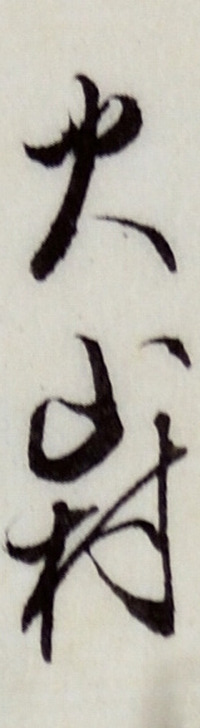火山村
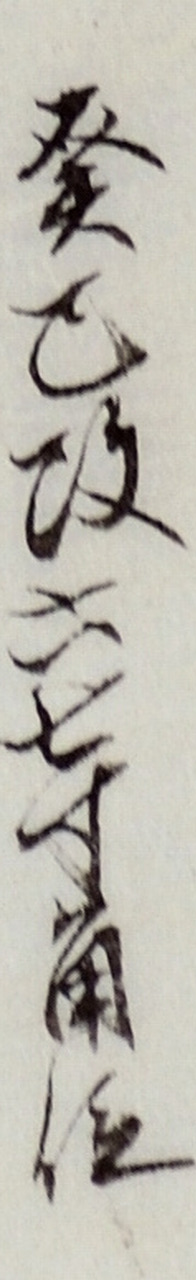癸巳改六七寸角位
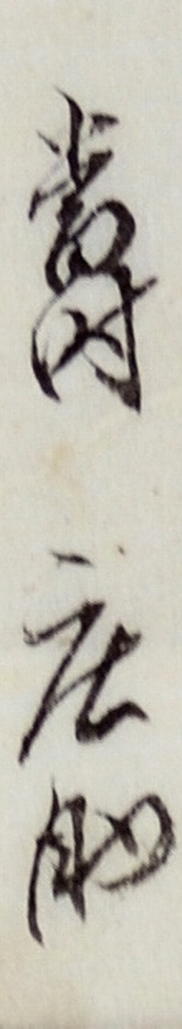当時庄助
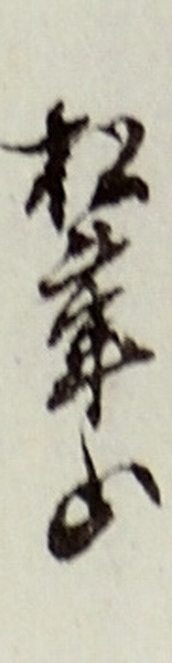松茸山
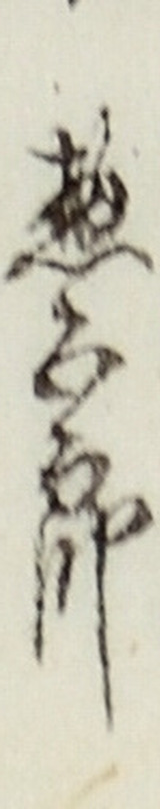惣五郎
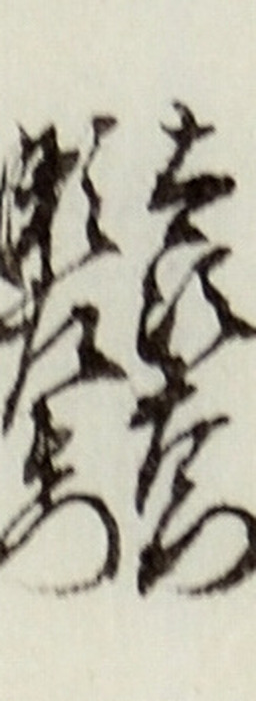瀬左衛門
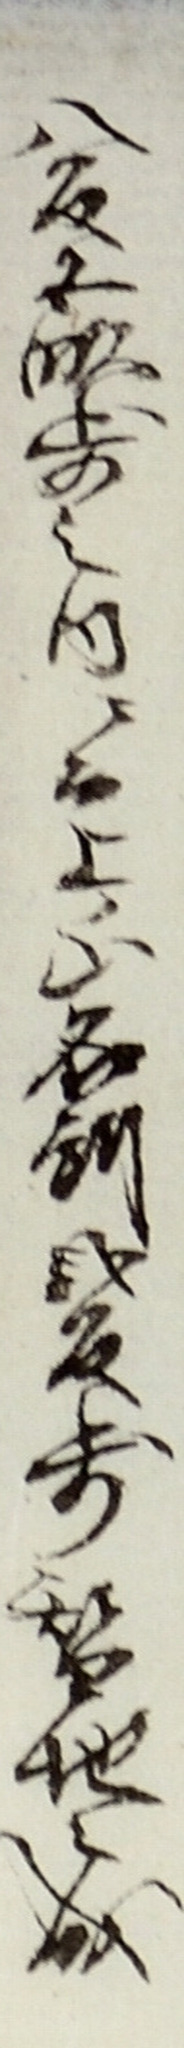八反五畝歩之内ニ而上ノ山名所弐反歩替地被成
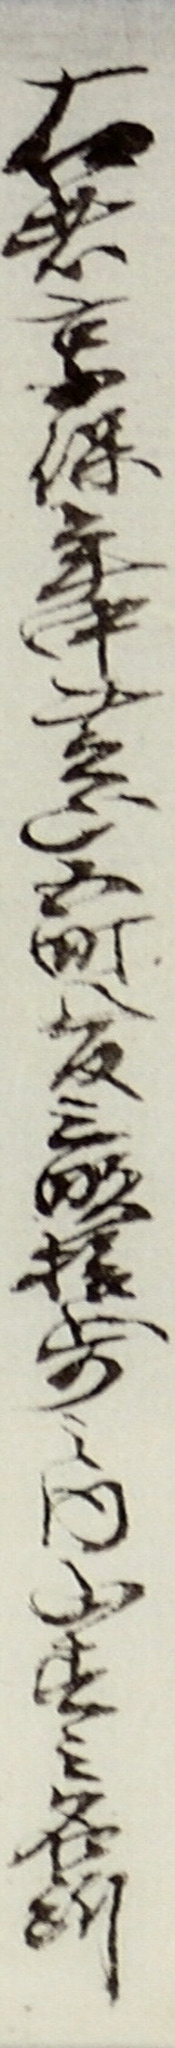右は享保年中芝山五町八反三畝拾歩之内山すみ名所
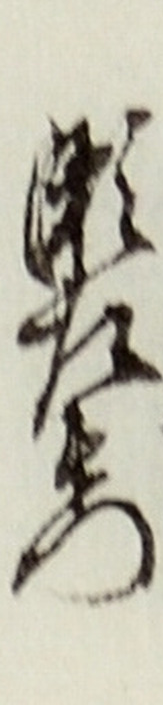瀬左衛門
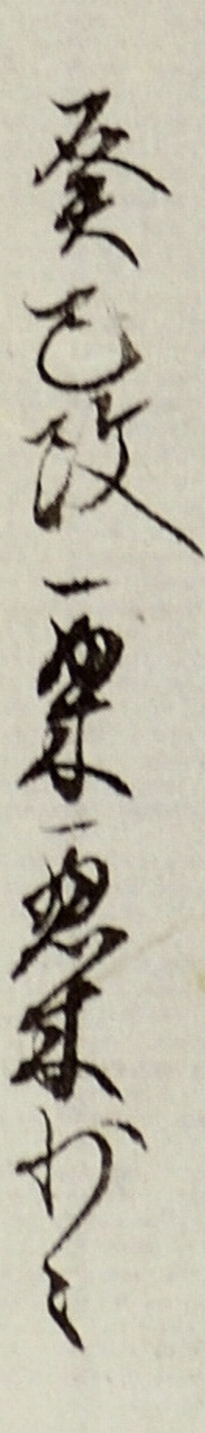癸巳改栗悪木少々

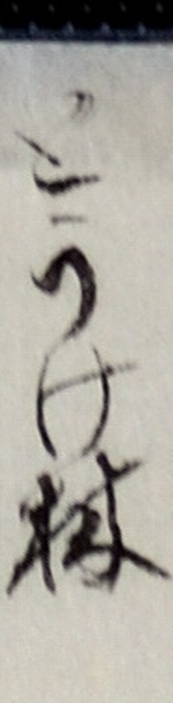とうけ林
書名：山林帳草稿
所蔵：伊那市立高遠町図書館・合同会社AMANE
